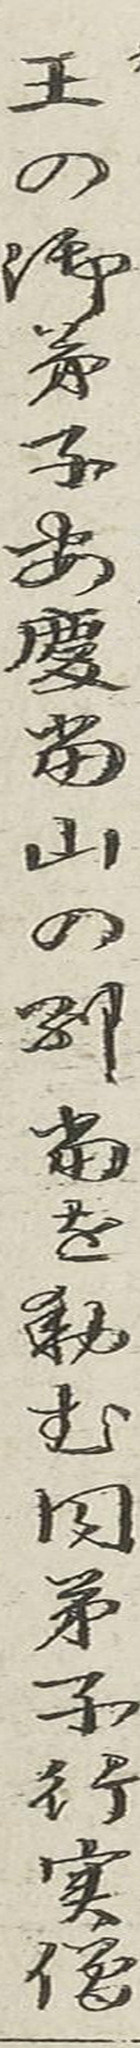王の御弟子安慶当山の別当を勉む同弟子行実僧
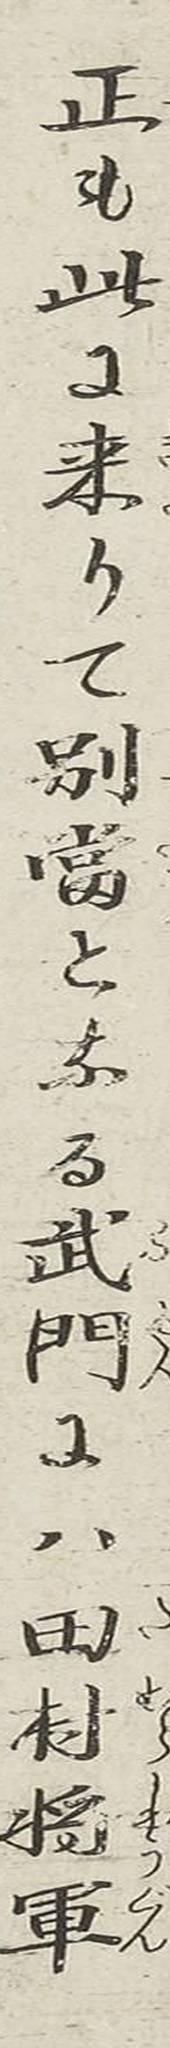正も此に来りて別当となる武門には田村将軍
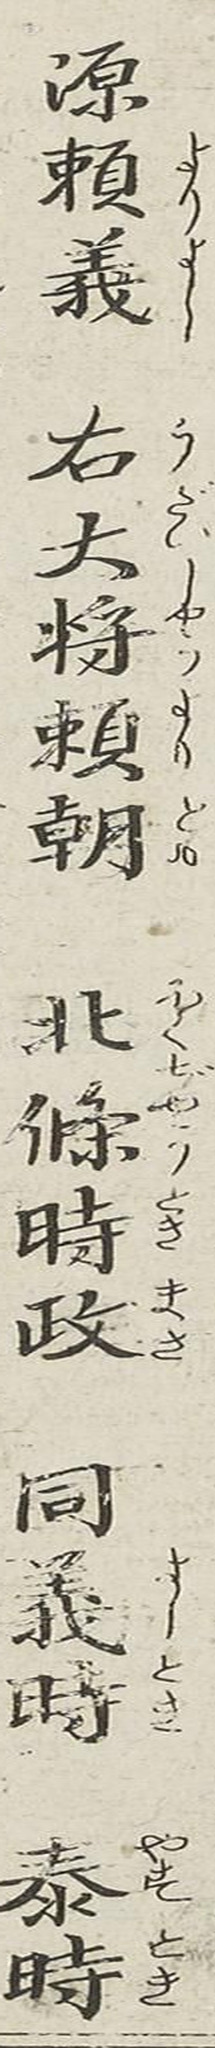源頼義右大将頼朝北條時政同義時泰時
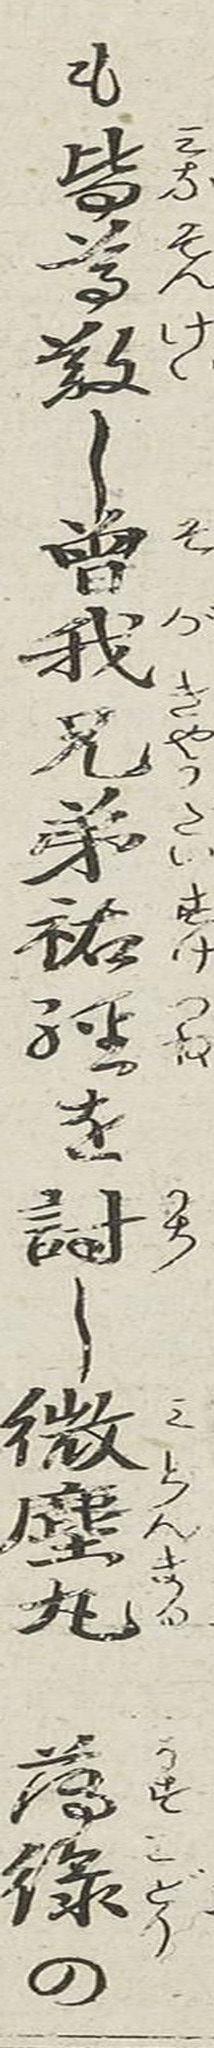も皆尊敬し曽我兄弟祐経を討し微塵丸薄緑の
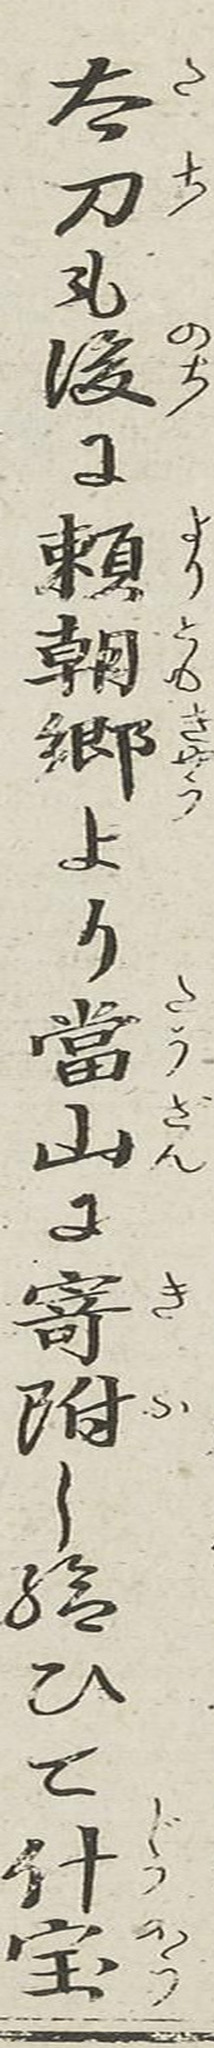太刀も後に頼朝郷より当山に寄附し給ひて什宝
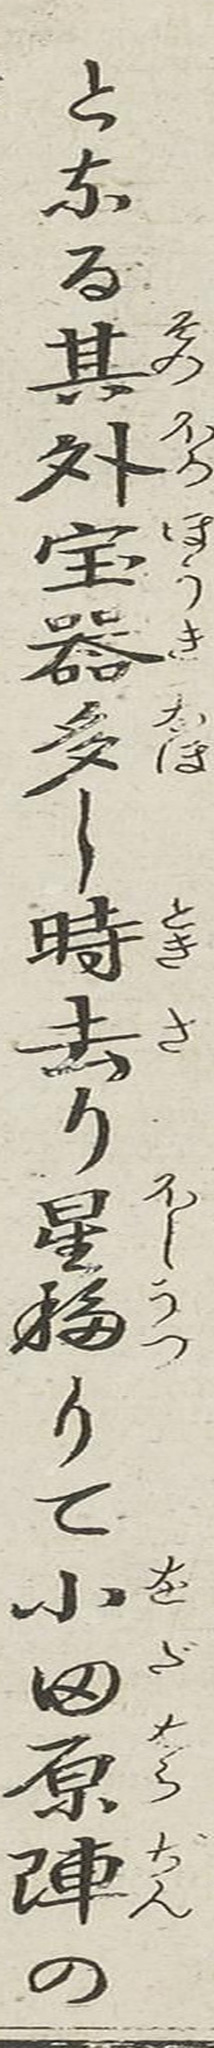となる其外宝器多し時去り星移りて小田原陣の
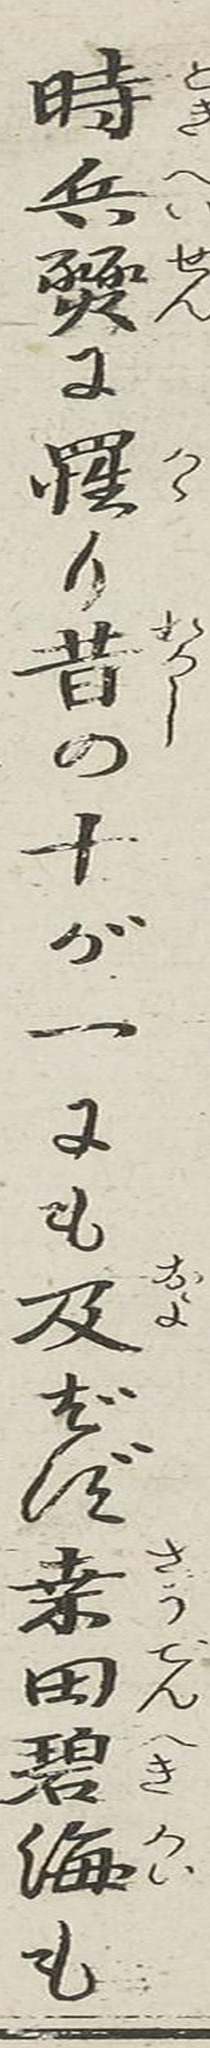時兵燹に罹り昔の十が一にも及ばず桑田碧海も
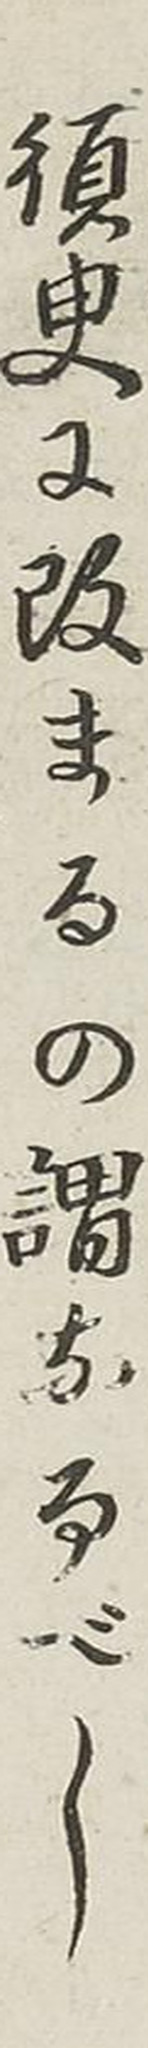須臾に改まるの謂なるべし
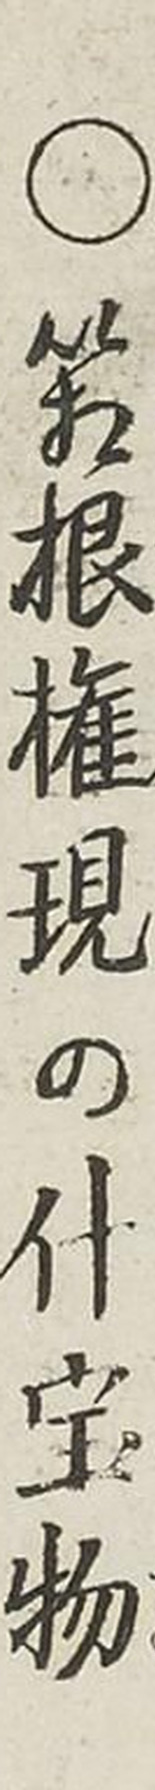〇箱根権現の什宝物
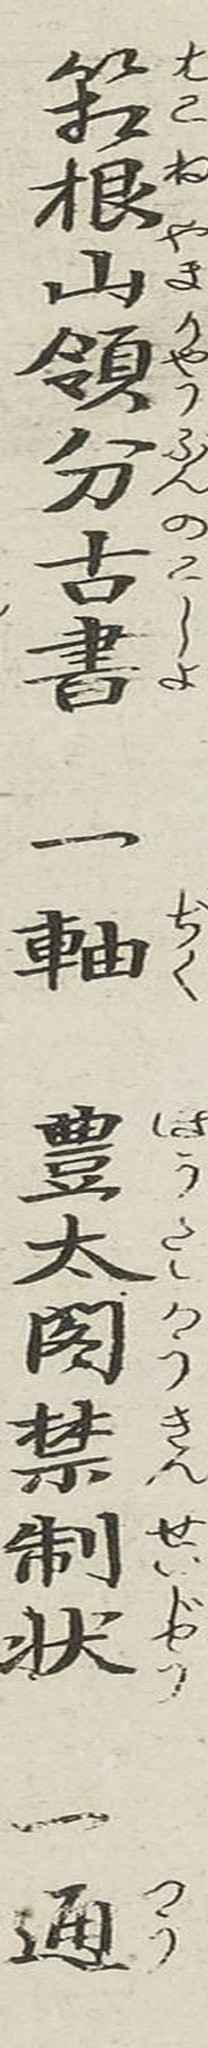箱根山領分古書一軸豊太閤禁制状一通
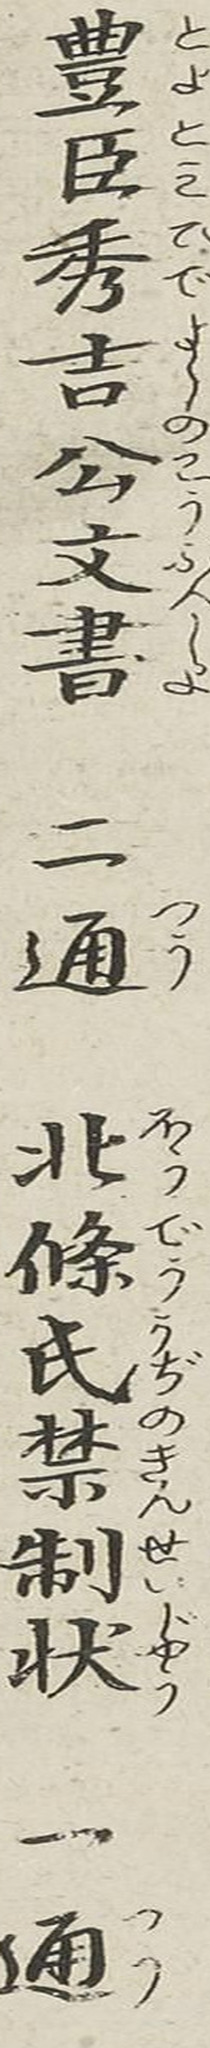豊臣秀吉公文書二通北條氏禁制状一通

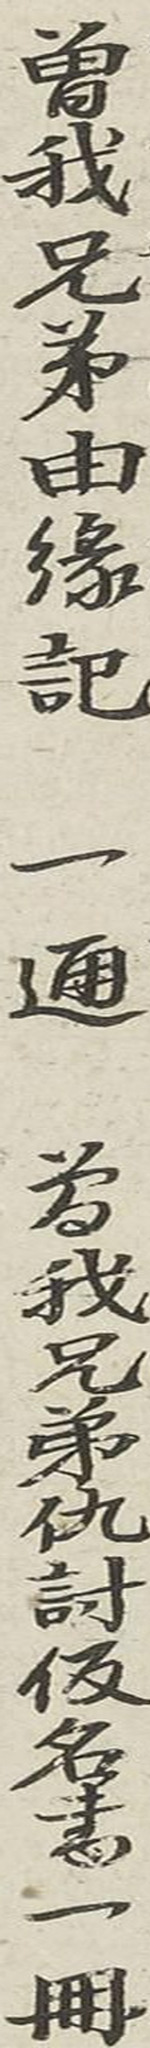曽我兄弟由縁記一通曽我兄弟仇討仮名書一冊
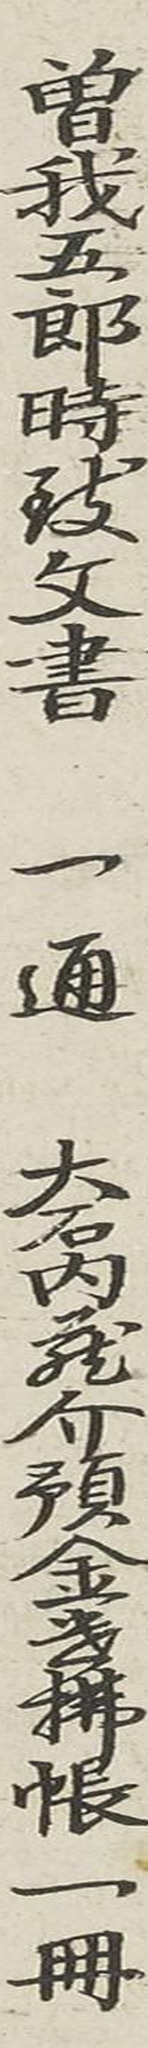曽我五郎時致文書一通大石内蔵介預金買払帳一冊
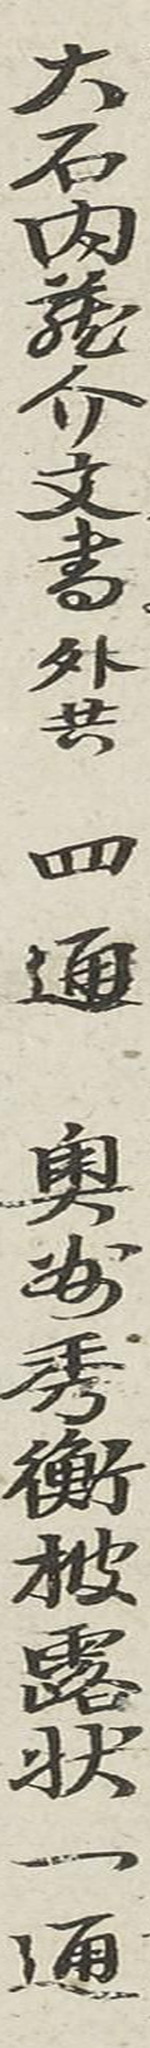大石内蔵介文書外共四通奥州秀衡披露状一通
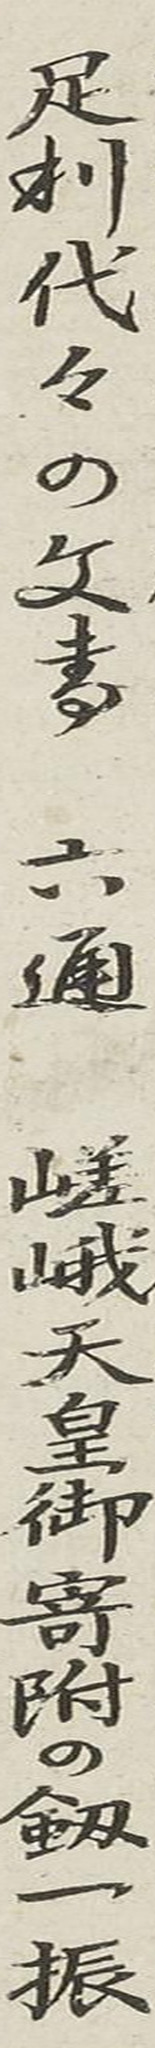足利代々の文書六通嵯峨天皇御寄附の剣一振
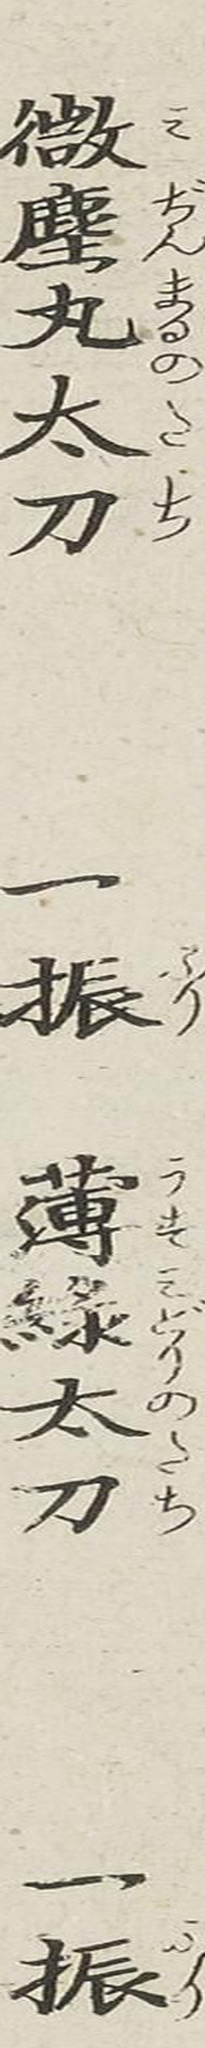微塵丸太刀一振薄緑太刀一振
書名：箱根温泉誌　全
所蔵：東京大学地震研究所図書室 Earthquake Research Institute Library, The University of Tokyo, JAPAN
